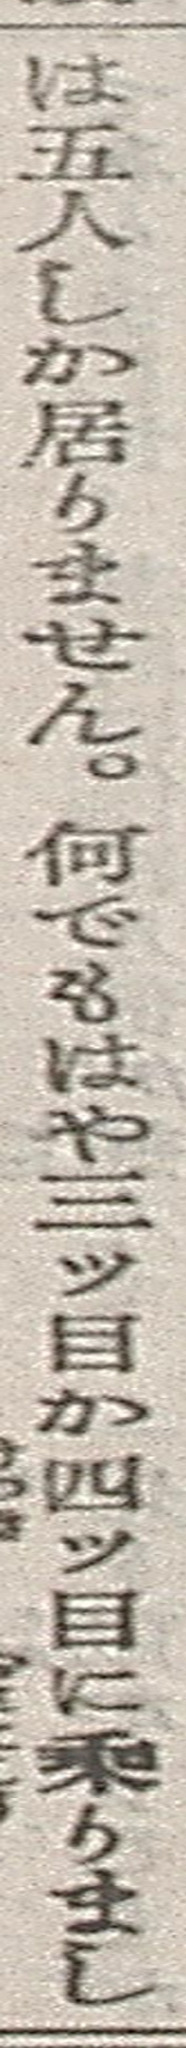は五人しか居りません。何でもはや三ツ目か四ツ目に乗りまし
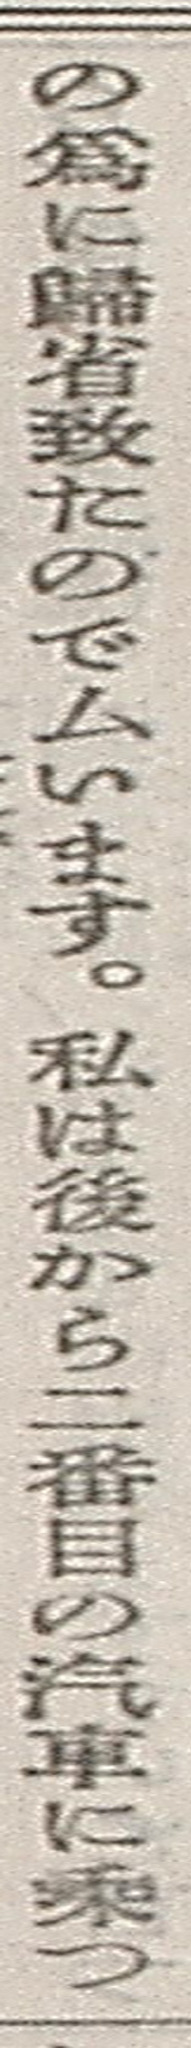の為に帰省致たのでムいます。私は後から二番目の汽車に乗つ
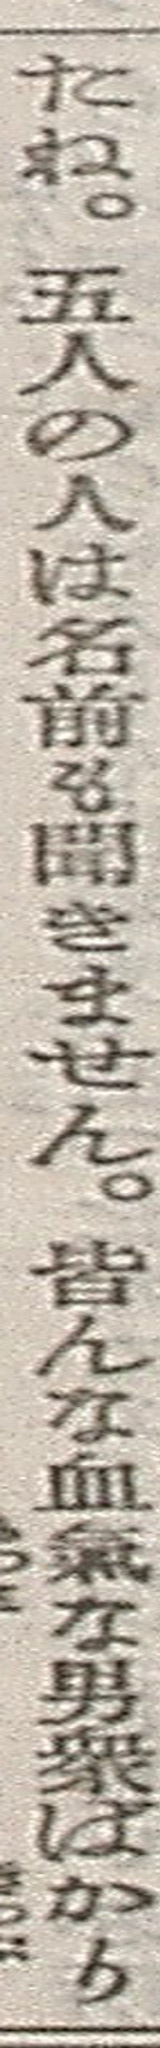たね。五人の人は名前も聞きません。皆んな血気な男衆ばかり
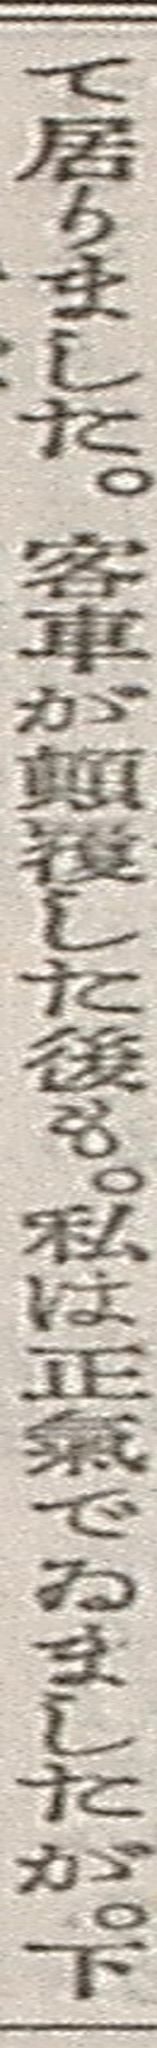て居りました。客車が顚覆した後も。私は正気でゐましたが。下
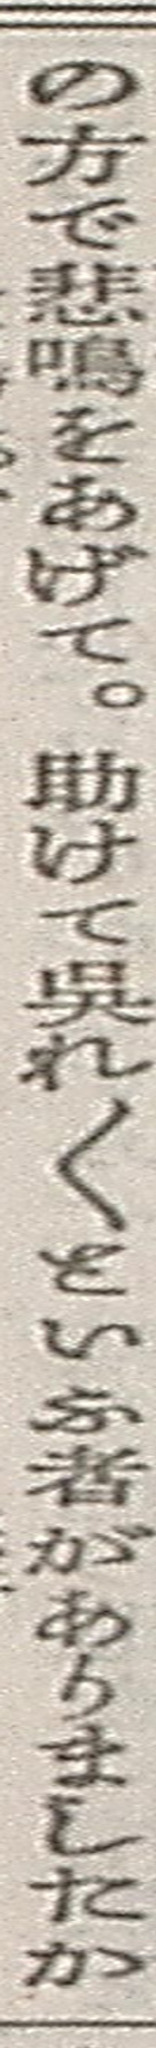の方で悲鳴をあげて。助けて呉れ〳〵といふ者がありましたか
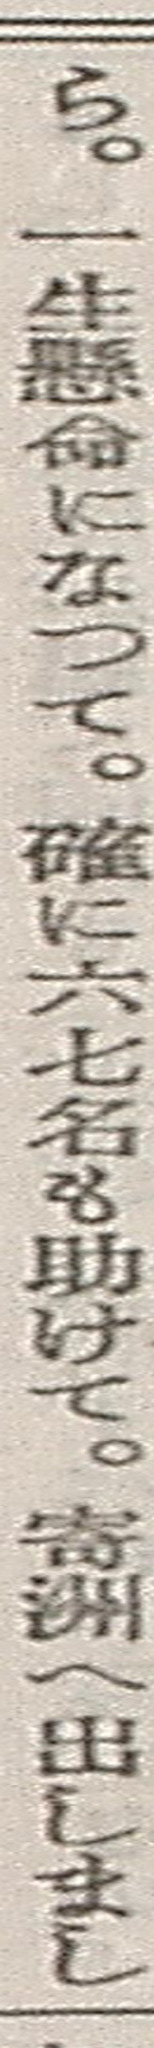ら。一生懸命になつて。慥に六七名も助けて。寄洲へ出しまし
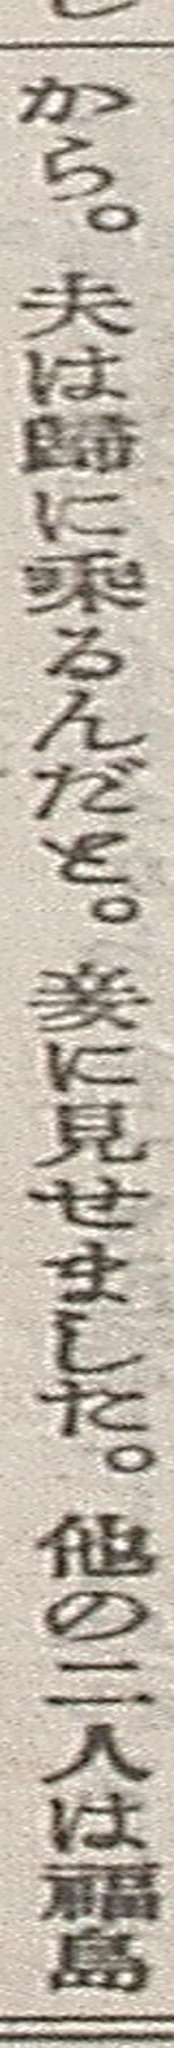から。夫は帰に乗るんだと。妾に見せました。他の二人は福島
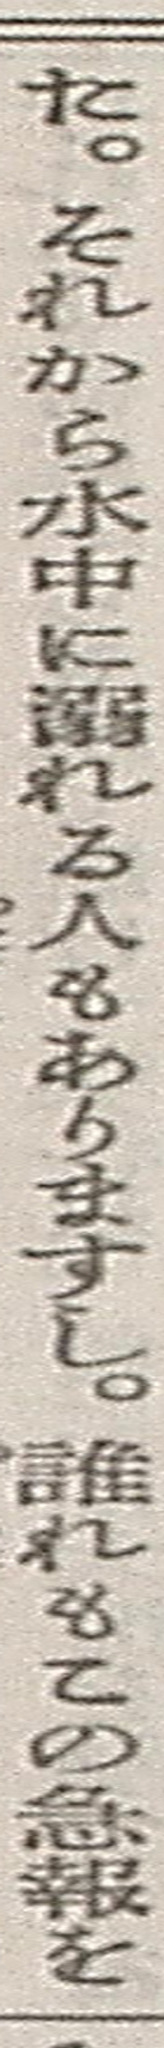た。それから水中に溺れる人もありますし。誰れもこの急報を
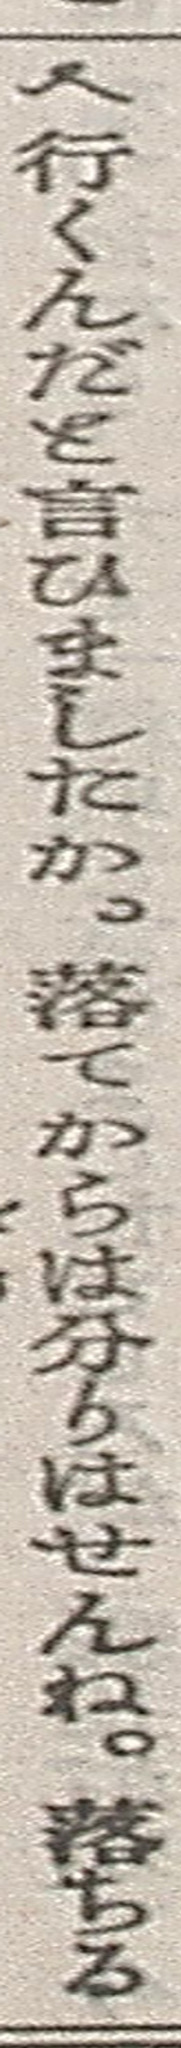へ行くんだと言ひましたか。落てからは分りはせんね。落ちる
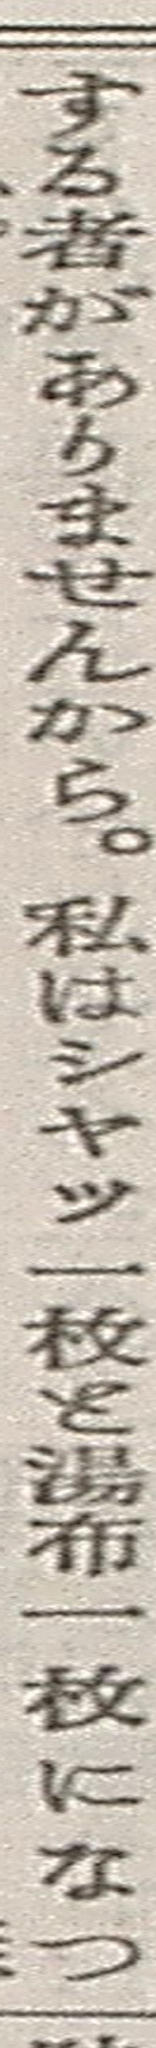する者がありませんから。私はシヤツ一枚と湯布一枚になつ
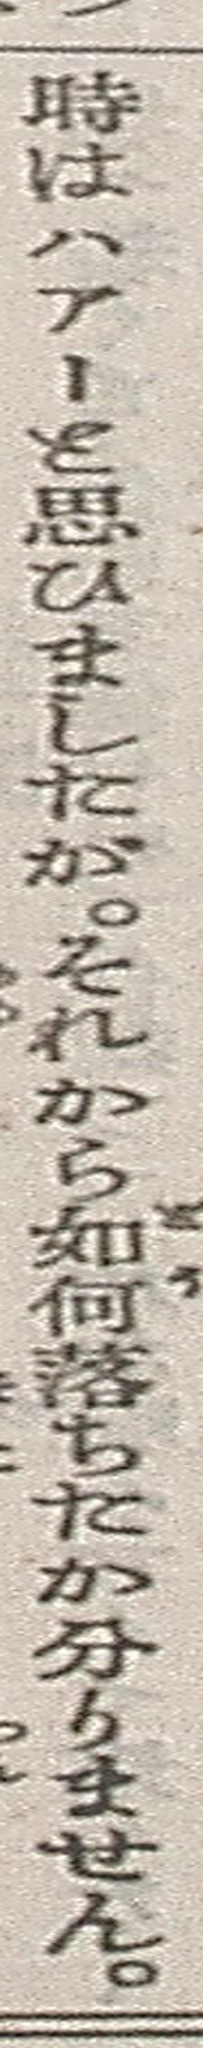時はハアーと思ひましたが。それから如何落ちたか分りません。
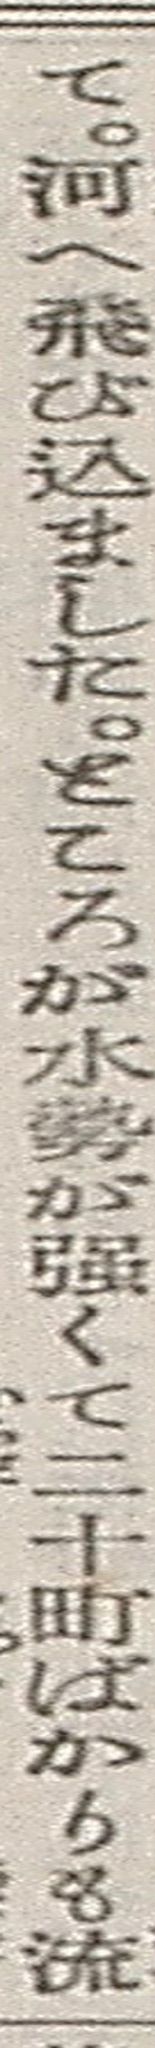て。河へ飛び込ました。ところが水勢が強くて二十町ばかりも流
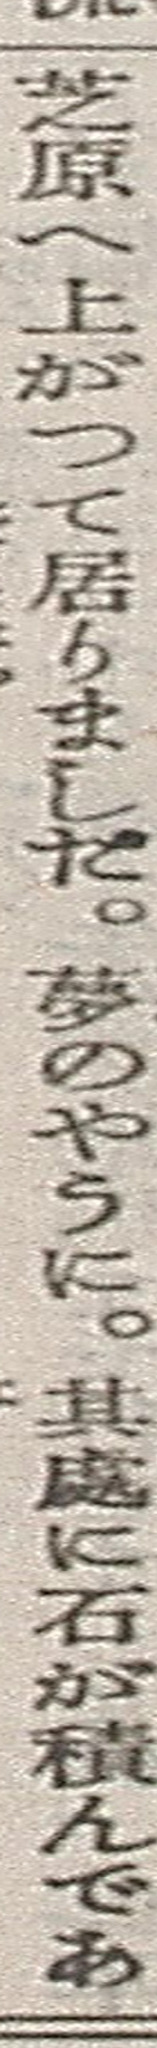芝原へ上がつて居りました。夢のやうに。其処に石が積んであ
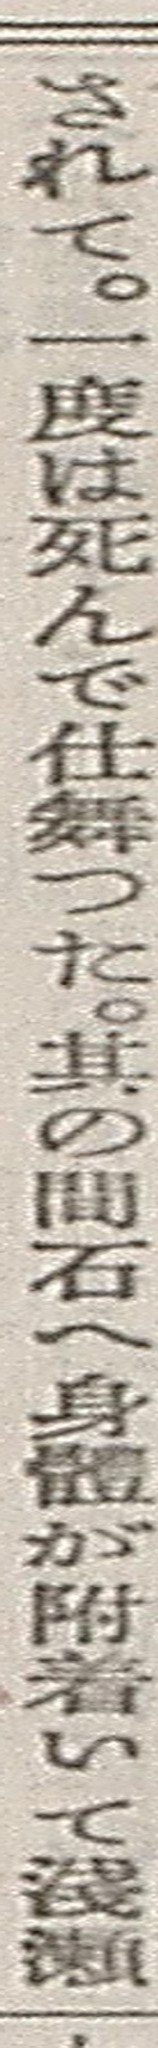されて。一度は死んで仕舞つた。其の間石へ身体が附着いて浅瀬
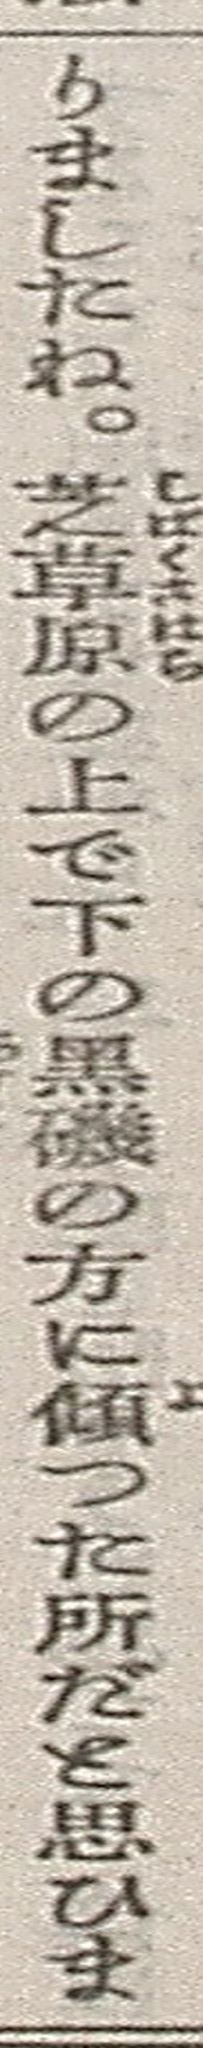りましたね。芝草原の上で下の黒磯の方に傾つた所だと思ひま
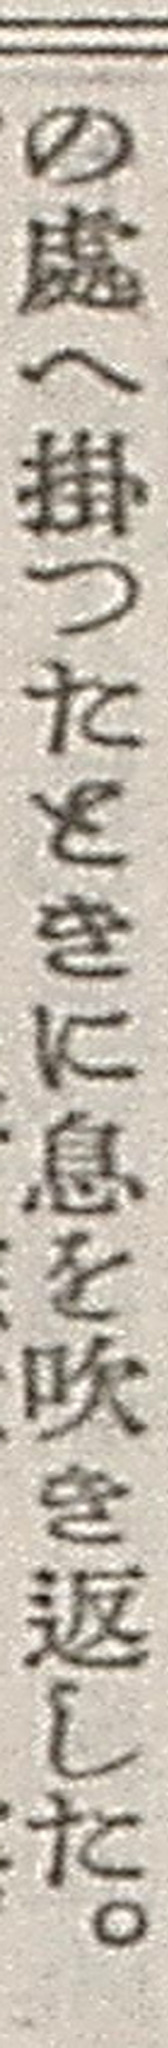の処へ掛つたときに息を吹き返した。
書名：風俗畫報臨時増刊第百九十九號　明治三十二年十月各地災害圖會（前編之續）
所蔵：東京大学地震研究所図書室 Earthquake Research Institute Library, The University of Tokyo, JAPAN
